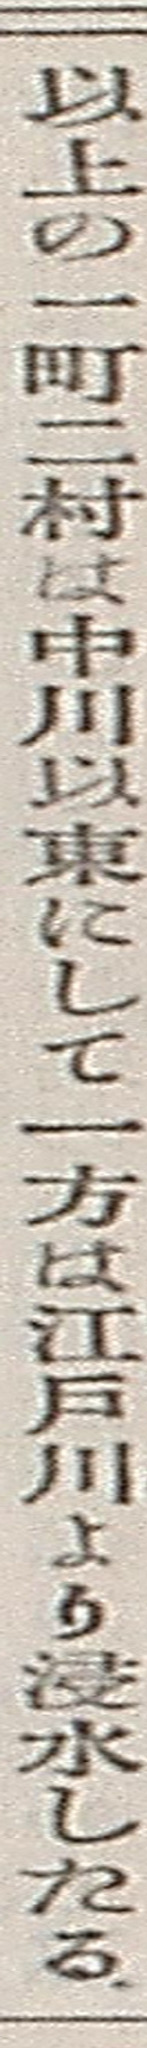以上の一町ニ村は中川以東にして一方は江戸川より浸水したる
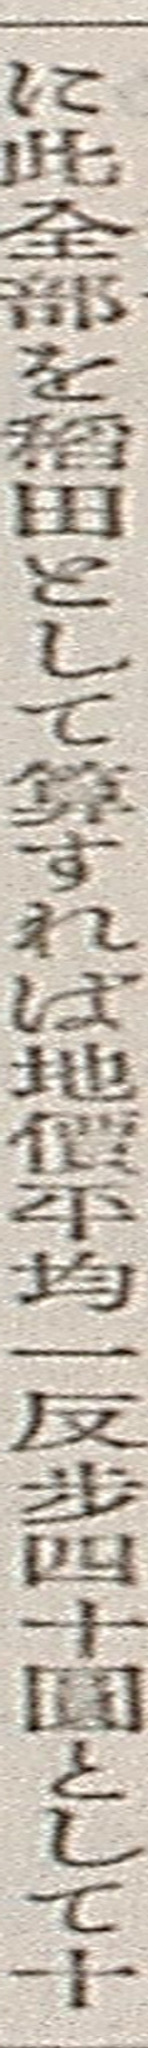に此全部を稲田として算すれば地価平均一反歩四十円として十
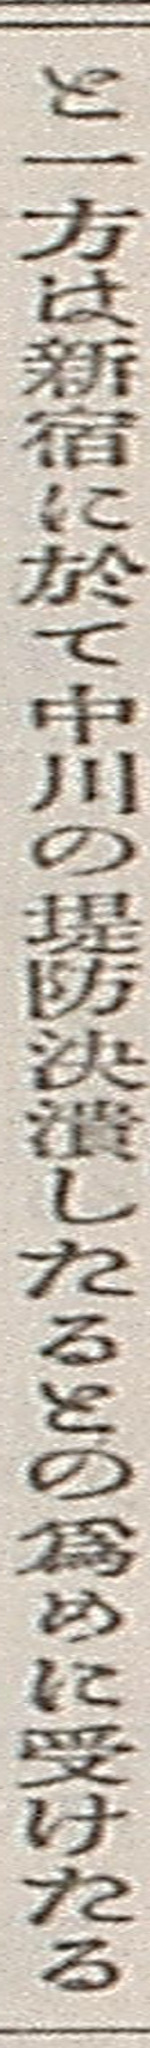と一方は新宿に於て中川の堤防決潰したるとの為めに受けたる
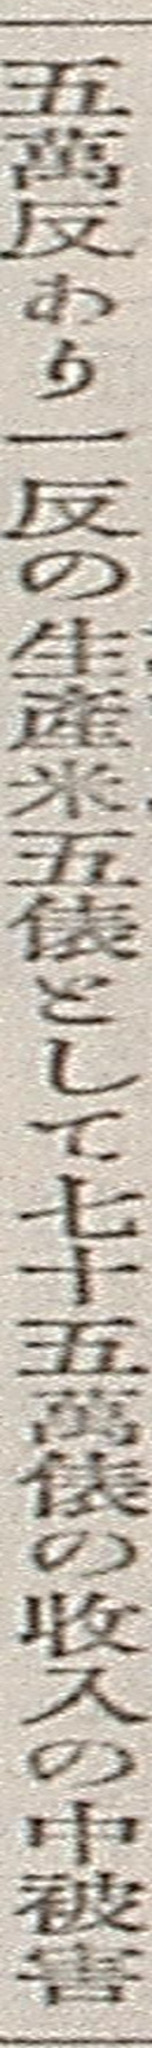五万反あり一旦の生産米五俵として七十五万俵の収入の中被害
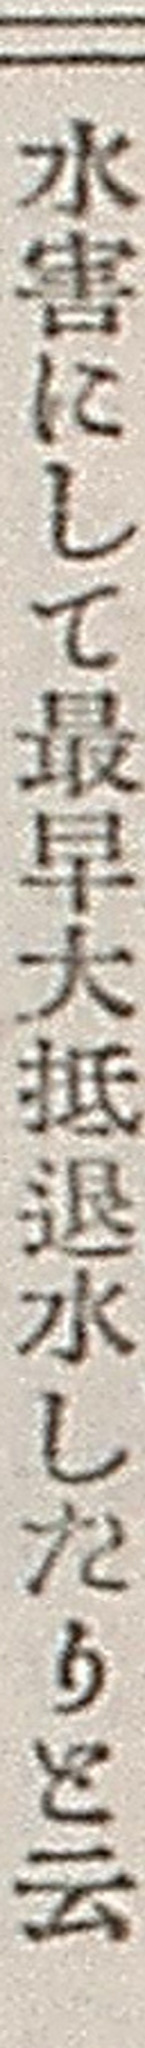水害にして最早大抵退水したりと云
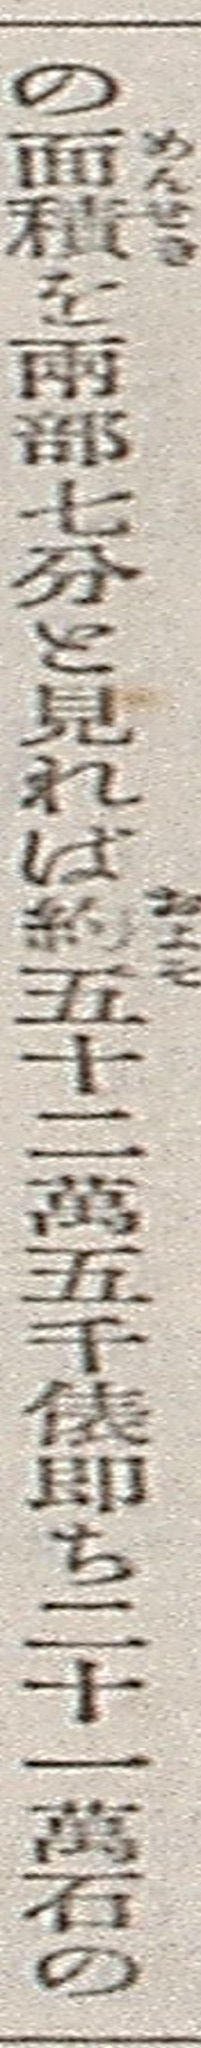の面積を両部七分と見れば約五十二万五千俵即ち二十一万石の
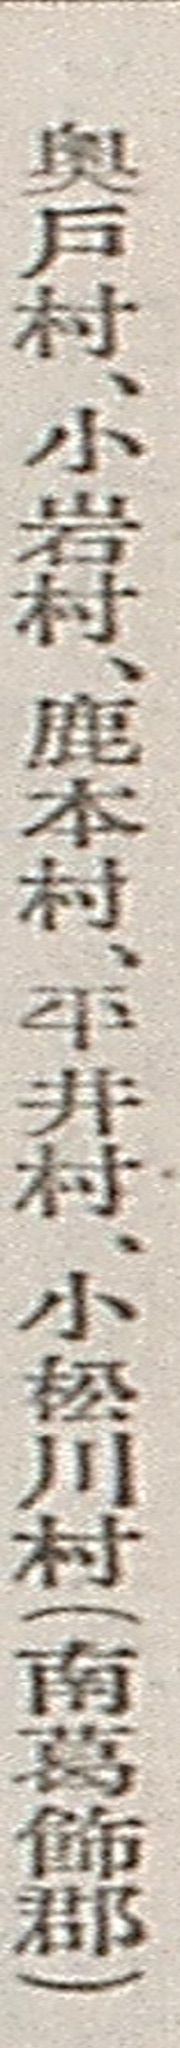奥戸村、小岩村、鹿本村、平井村、小松川村
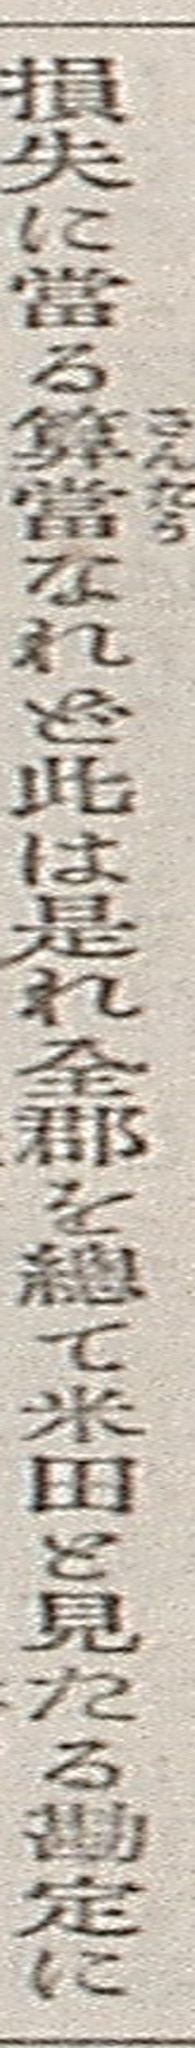損失に当る算当なれど此は是れ全部を総て米田と見たる勘定に
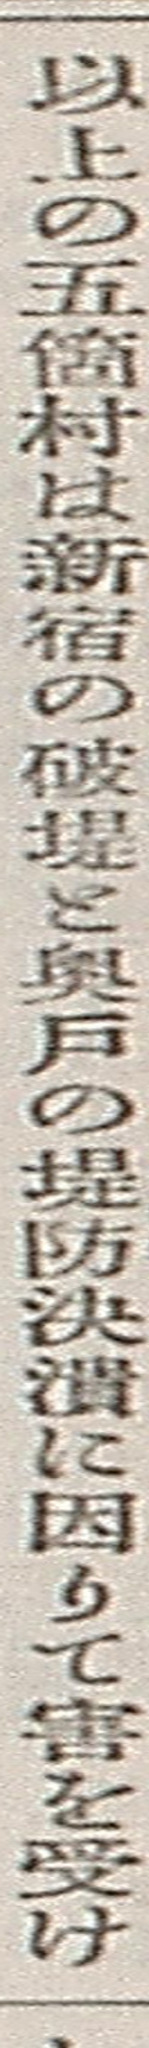以上の五箇村は新宿の破堤と奥戸の堤防決潰に因りて害を受け
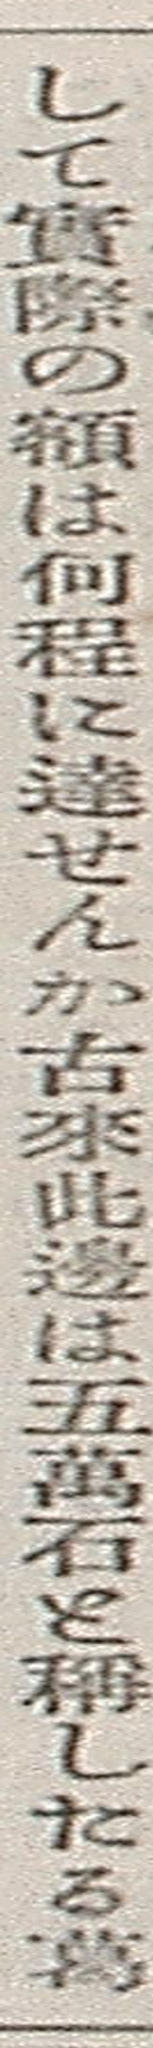して実際の額は何程に達せんか古来此辺は五万石と称したる葛
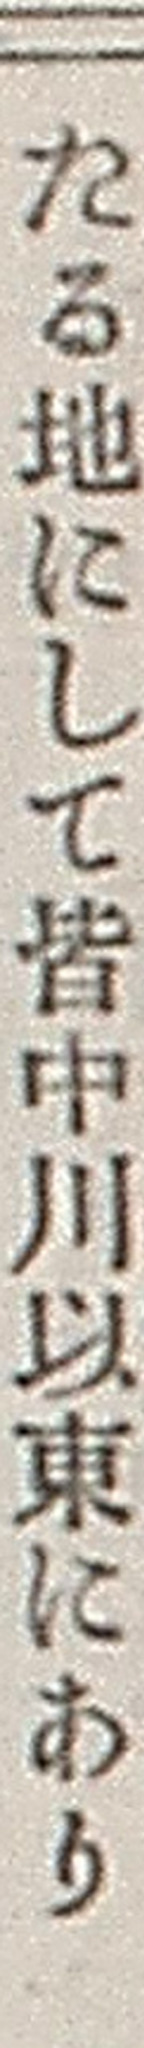たる地にして皆中川以東にあり
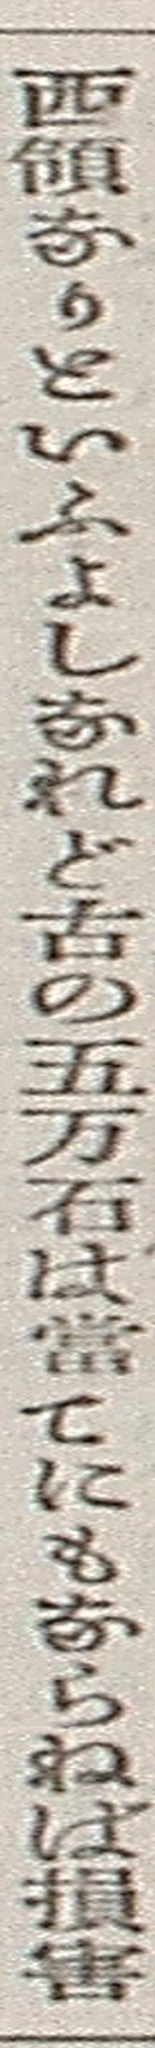西領なりといふよしなれど古の五万石は当てにもならねば損害
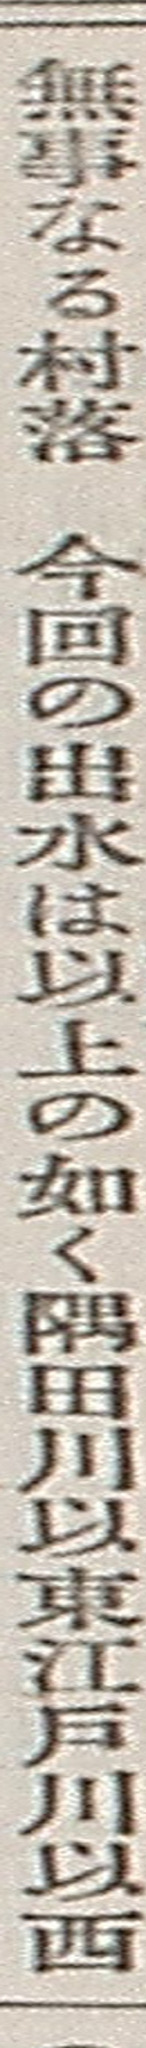無事なる村落今回の出水は以上の如く隅田川以東江戸川以西
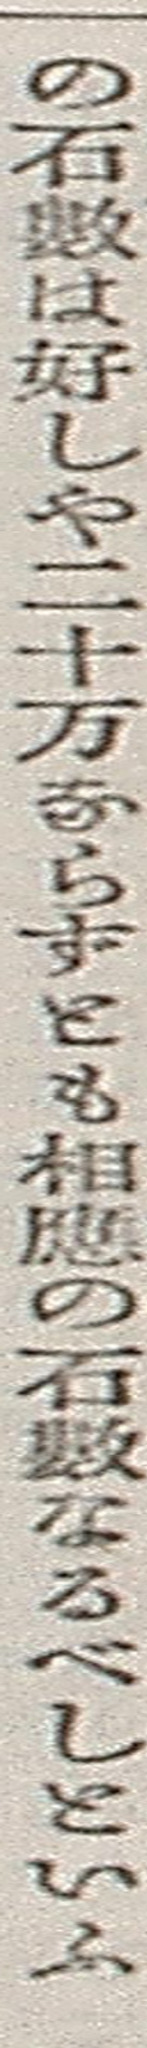の石数は好しや二十万ならずとも相応の石数なるべしといふ

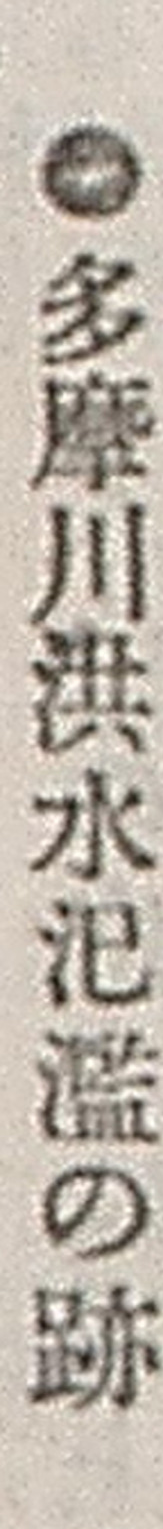●多摩川洪水氾濫の跡
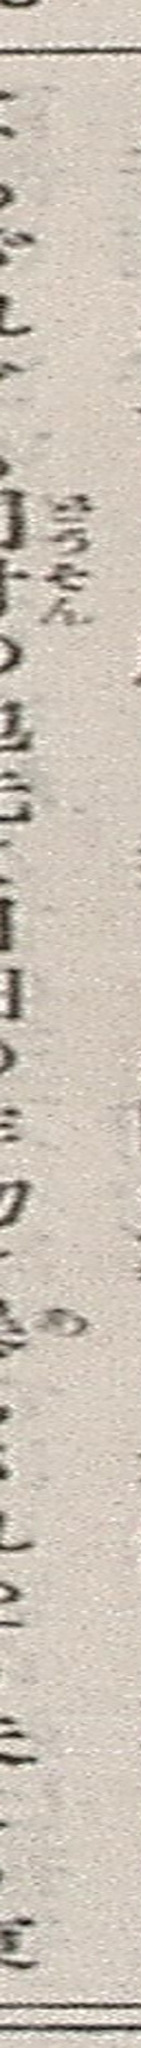ならざれども同村の地先は田畑の作物を暴らされたり夫より東
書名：風俗畫報臨時増刊第百二十四號　洪水地震被害録（上）
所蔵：東京大学地震研究所図書室 Earthquake Research Institute Library, The University of Tokyo, JAPAN
